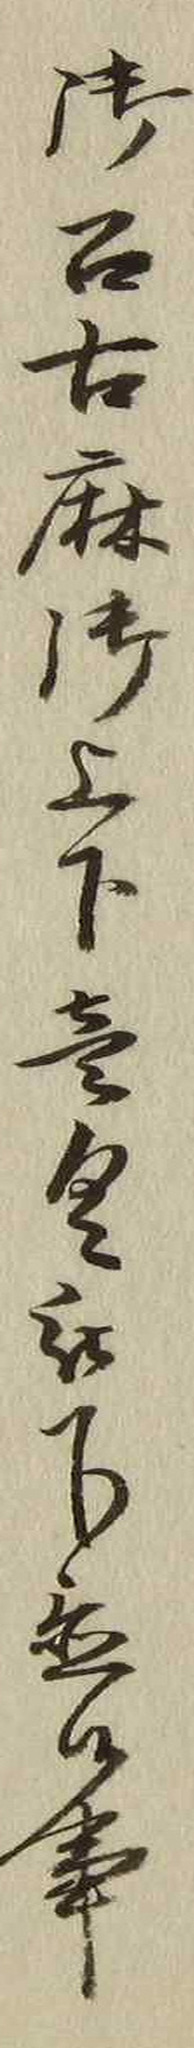御召古麻御上下壱具被下置候事
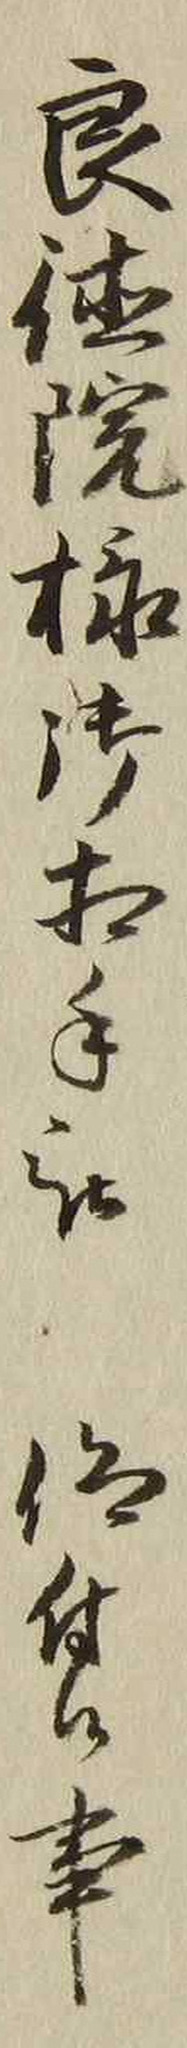良徳院様御相手被仰付候事
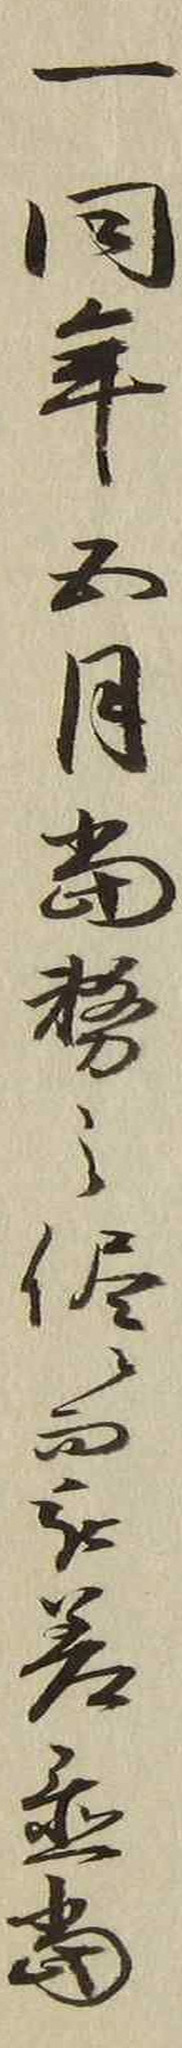一同年五月当務之儘ニ而被差置当
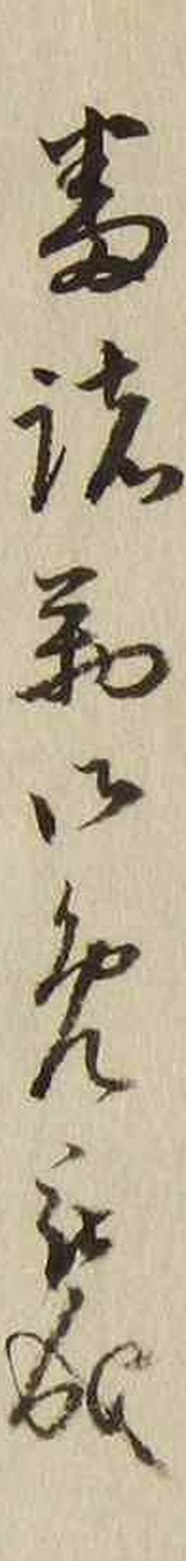番諸勤御免被成
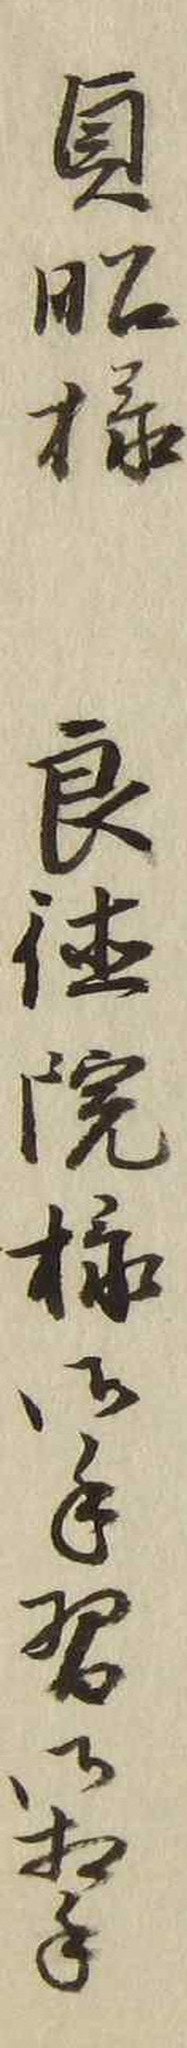貞昭様良徳院様御手習御相手

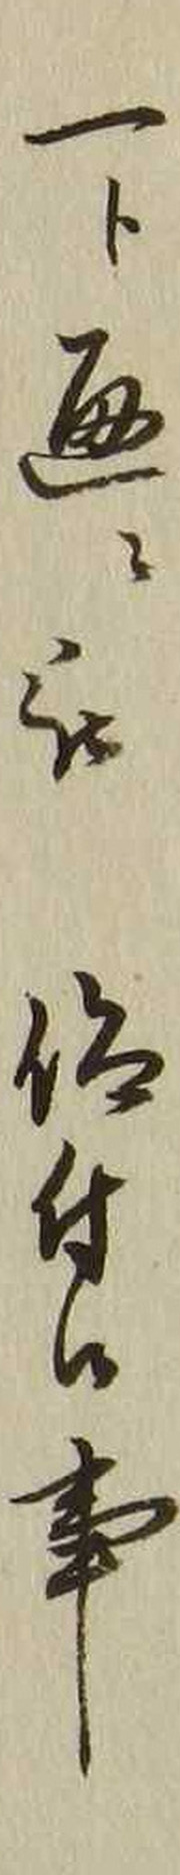一ト通ニ被仰付候事
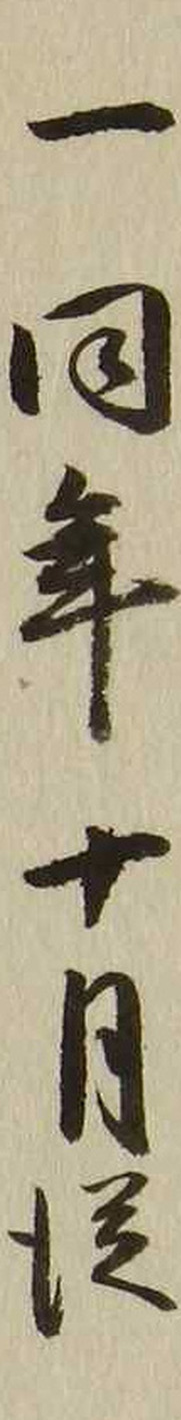一同年十月従
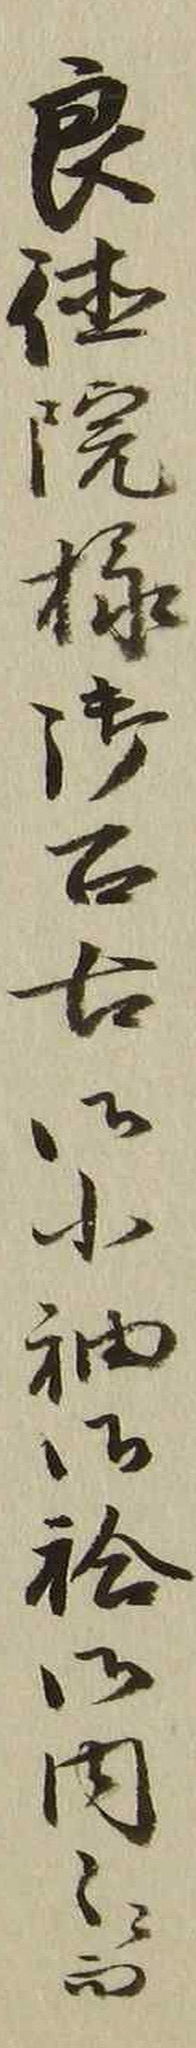良徳院様御召古御小袖御袷御内々ニ而
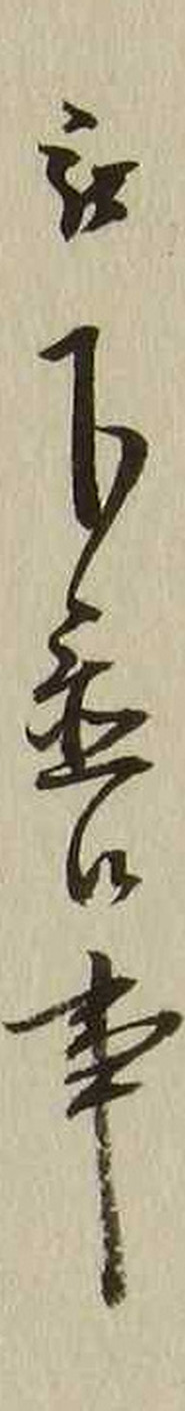被下置候事
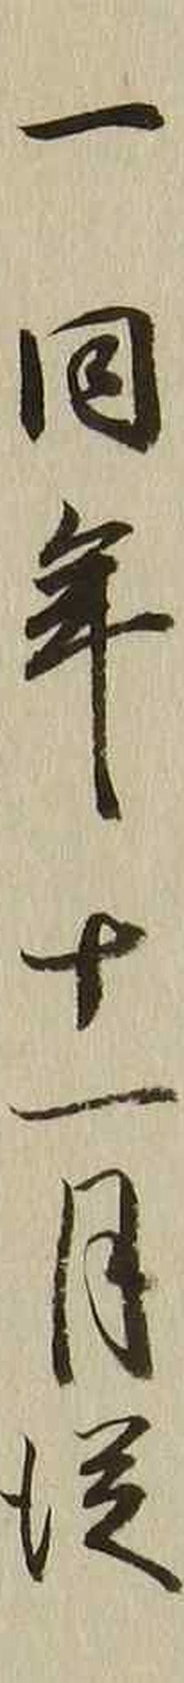一同年十一月従
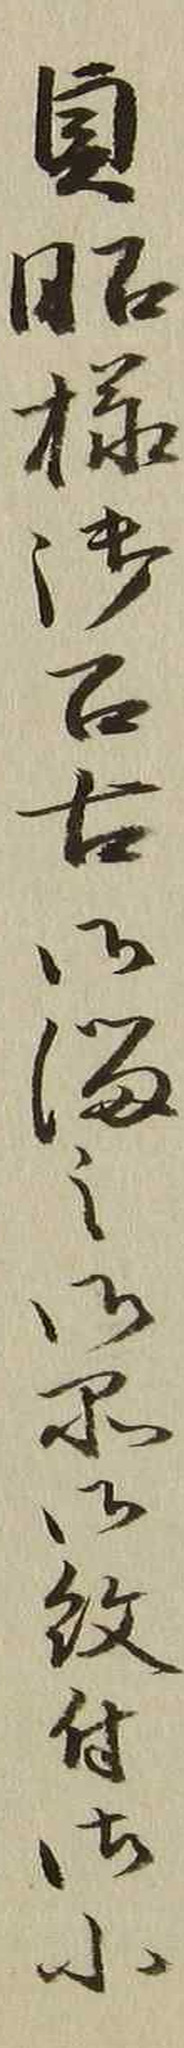貞昭様御召古御溜之御品御紋付御小
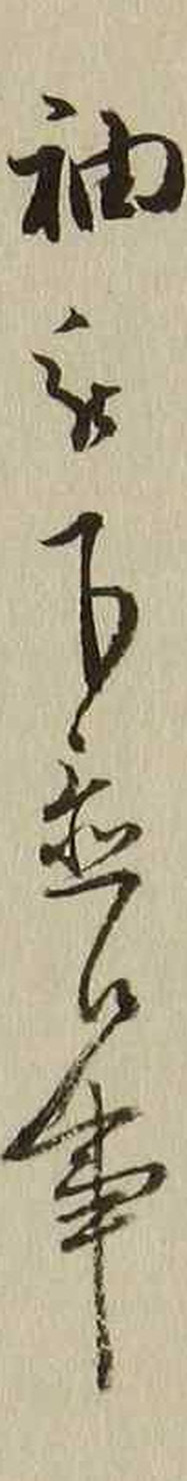袖被下置候事
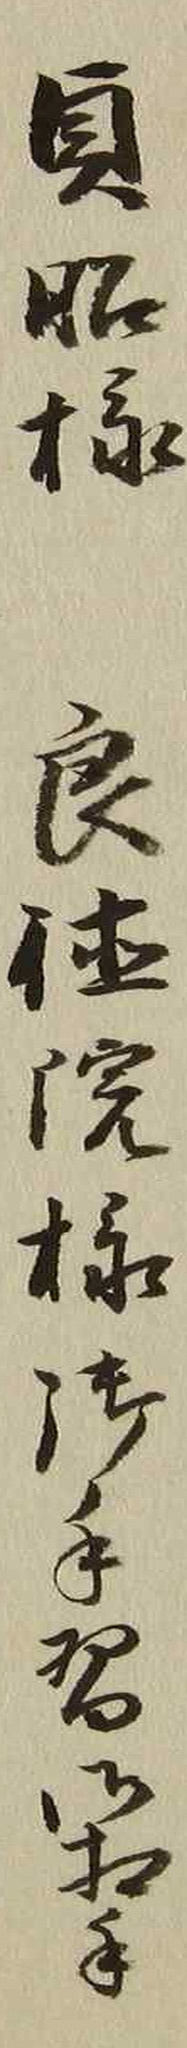貞昭様良徳院様御手習御相手
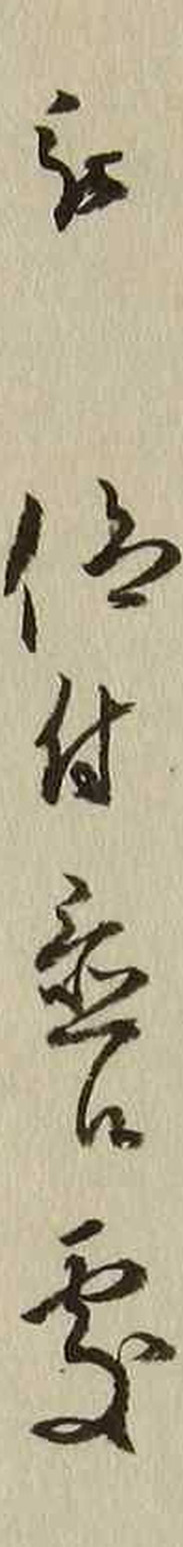被仰付置候処
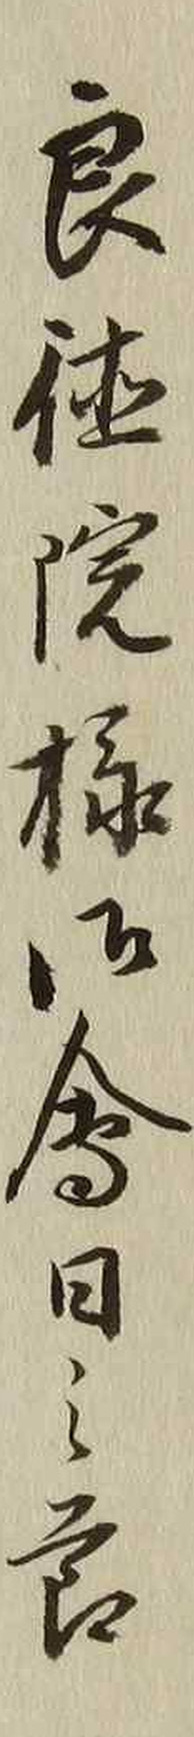良徳院様御会日之節
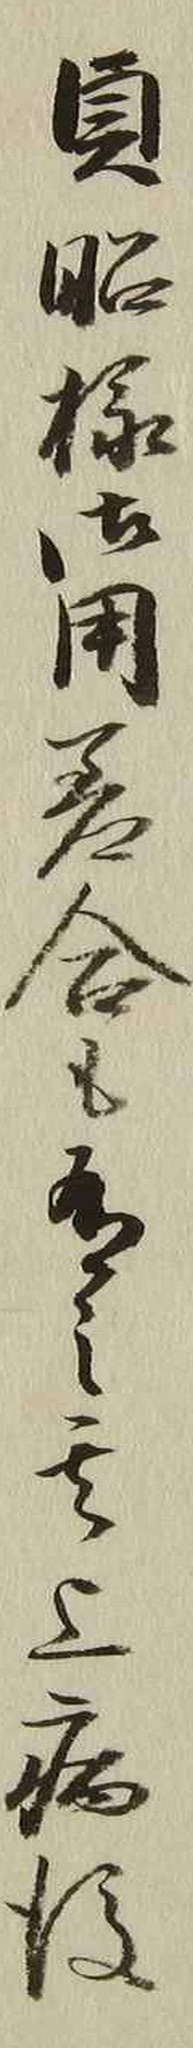貞昭様御用差合も有之其上病後
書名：諸士系譜　巻之61　と之部4
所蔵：会津若松市立会津図書館
